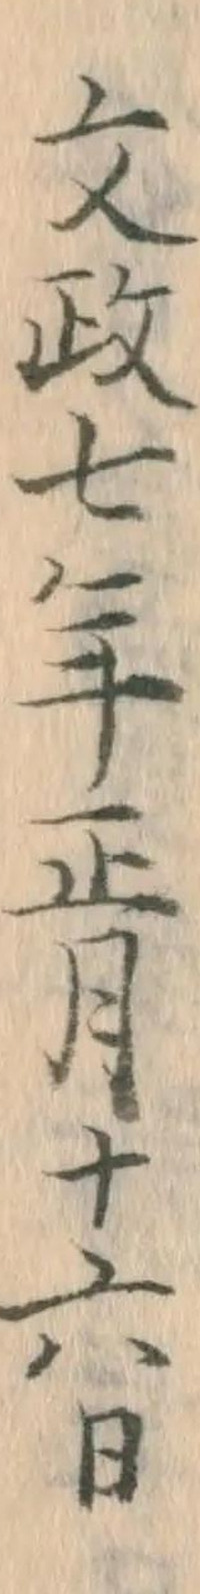文政七年正月十六日
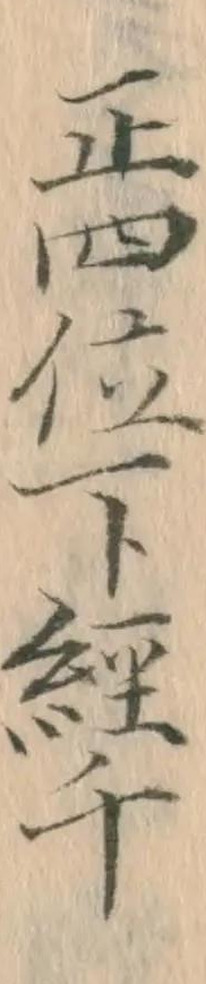正四位下経千
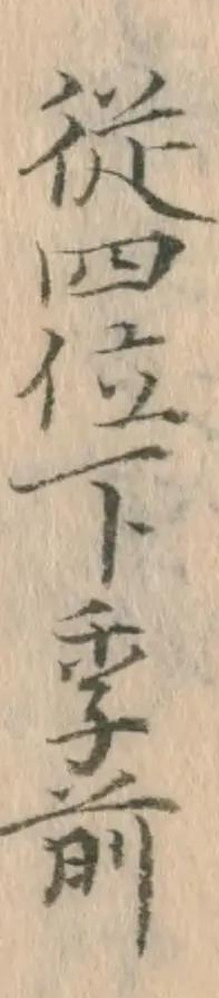従四位下季前
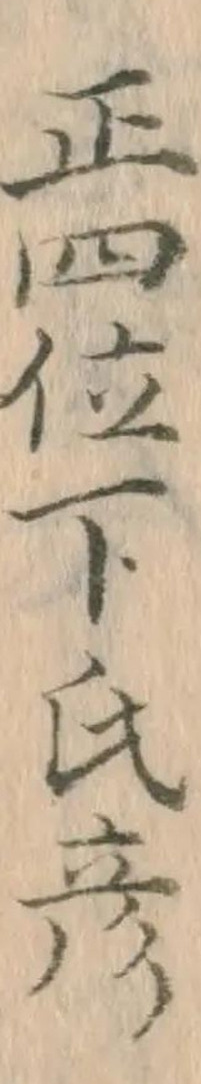正四位下氏彦
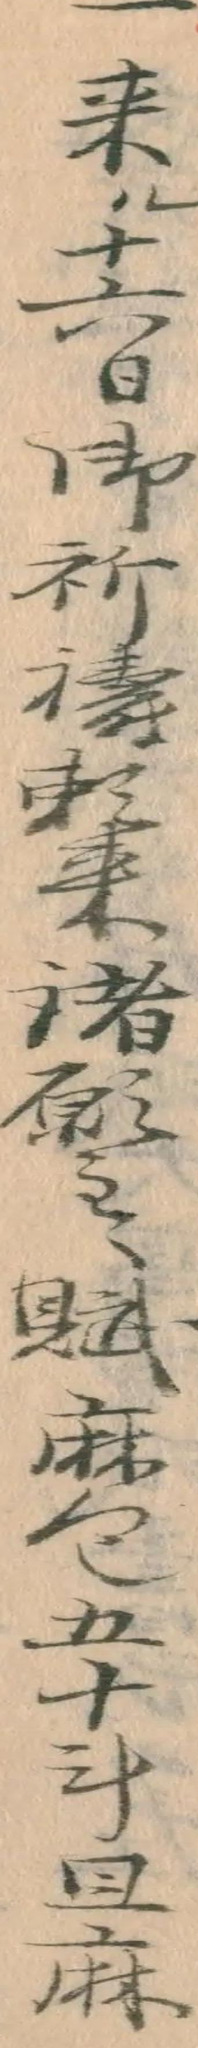一来ル十六日御祈祷頼来諸願主へ賦麻包五十斗且麻
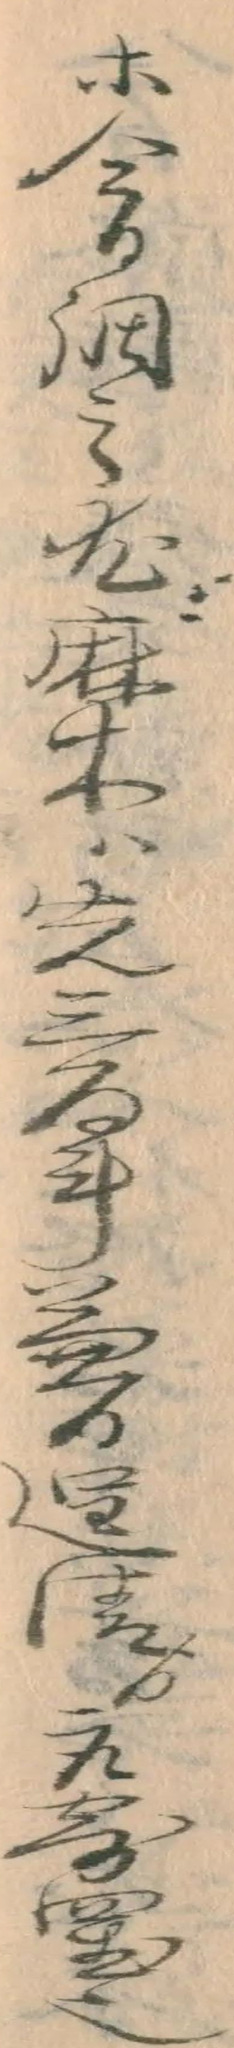等今日調之尤麻木ハ先三百斗兼日逞清ゟ取寄置也
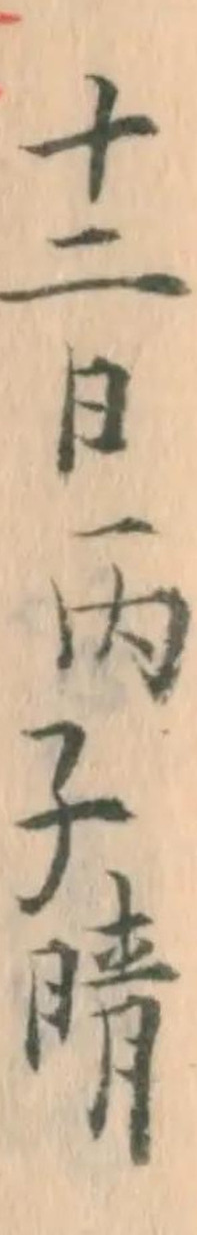十二日丙子晴
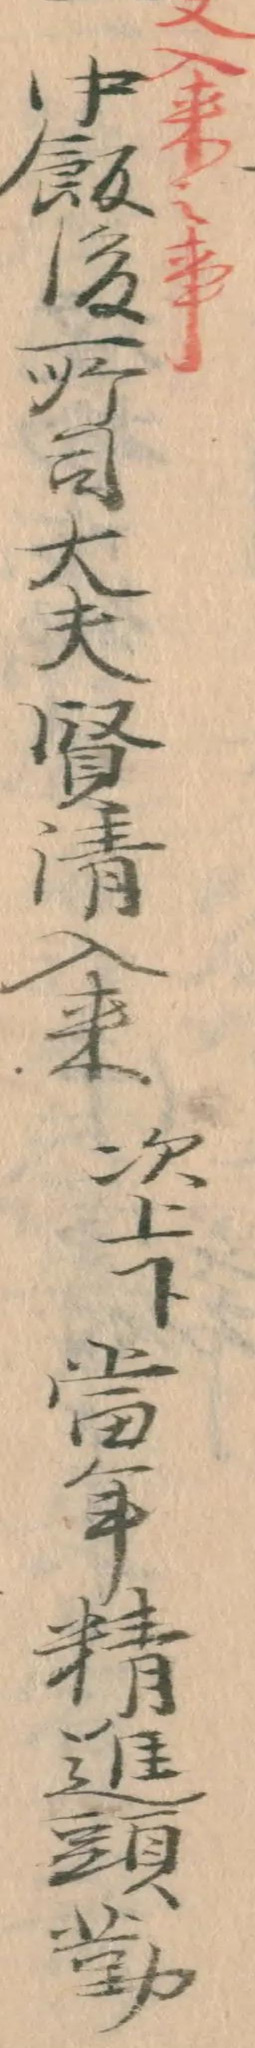一中飯後所司大夫賢清入来次上下當年精進頭勤
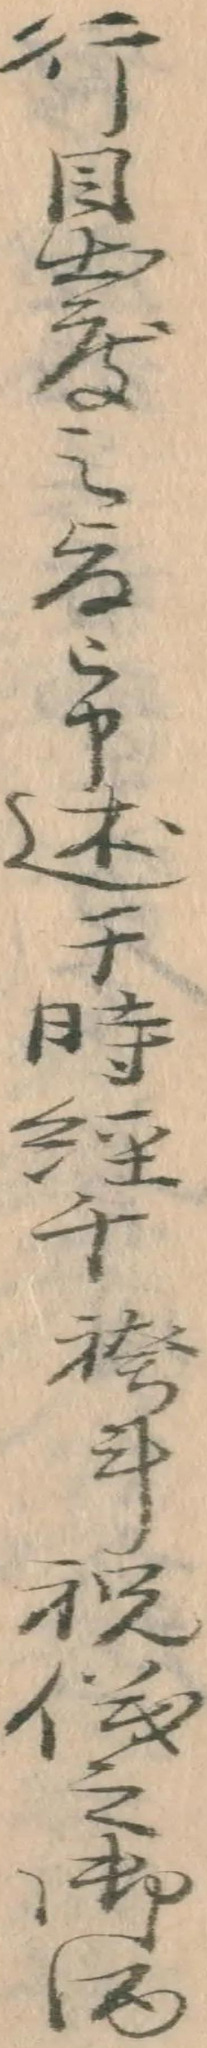行目出度之旨被申述于時経千袴斗祝儀之御酒
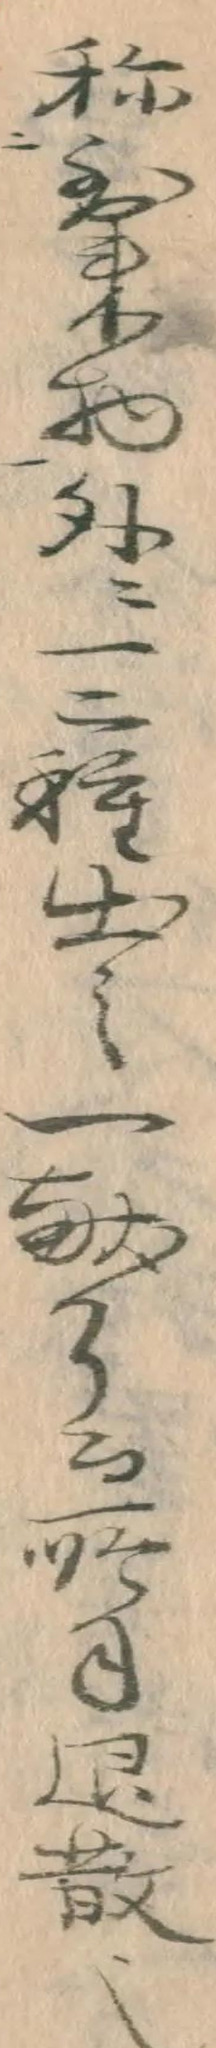称到来物外ニ一二種出之一献了而所司退散也
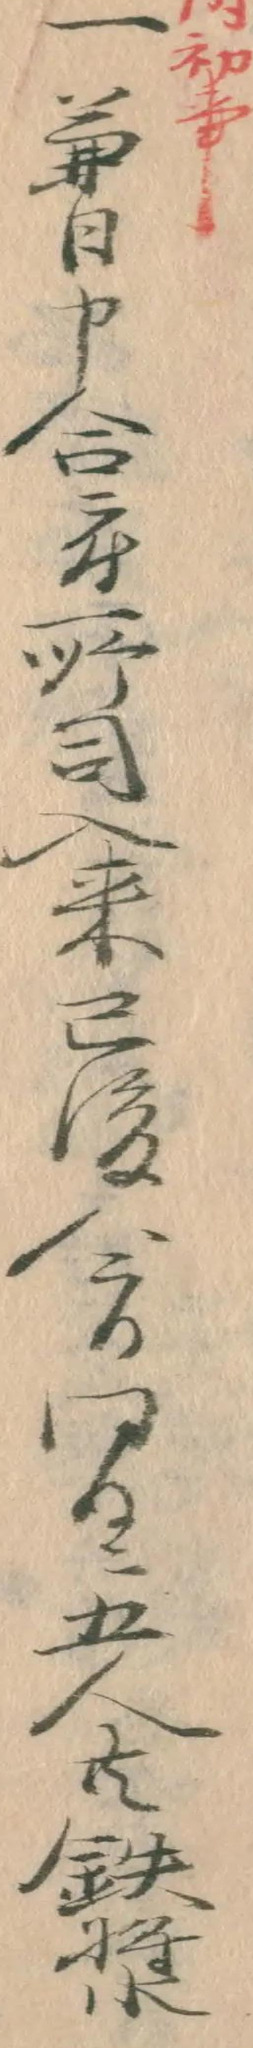一兼日申合ニ付所司入来已後今日同日ニ五人共鉄漿
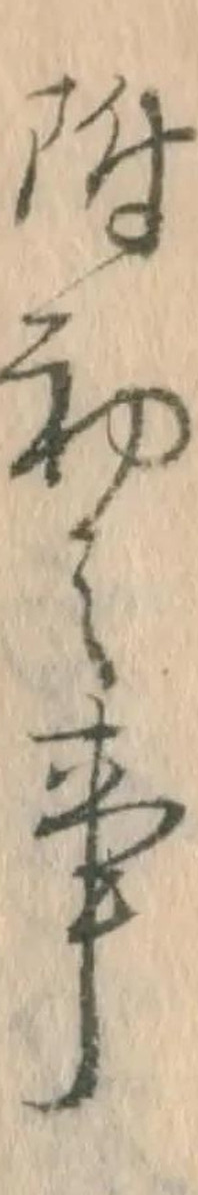附初之事
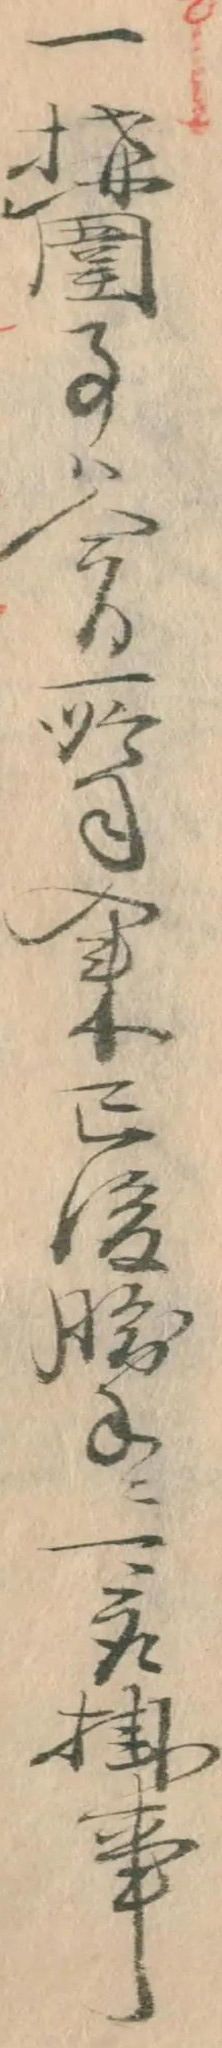一構圍事ハ今日所司入来已後勝手ニ可取掛事
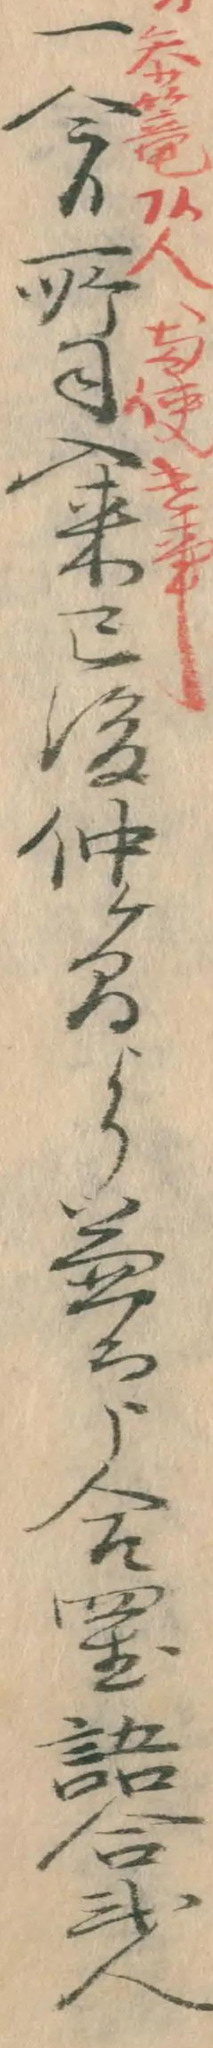一今日所司入来已後仲ヶ間より兼而申合四国語合弐人

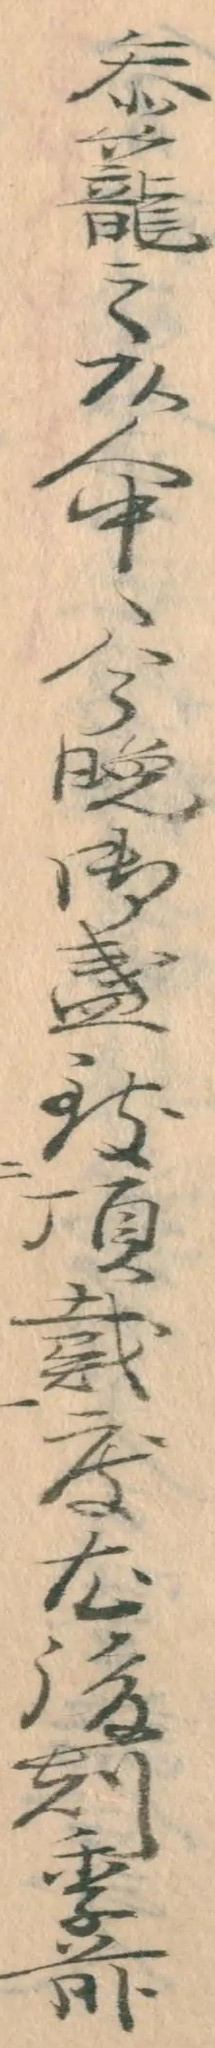参籠之頭人中へ今晩御盞被頂戴度尤後刻季前
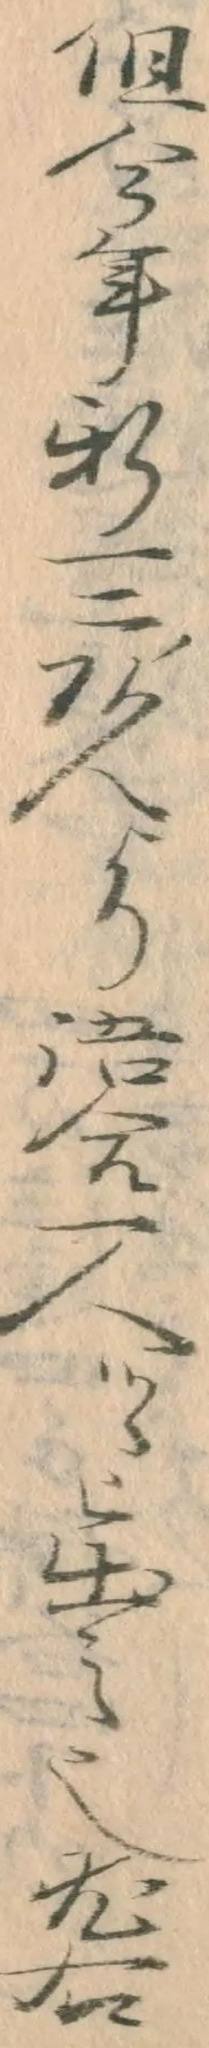但今年新一二頭人より語合一人ツヽ被出之也尤右
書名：賀茂社記録. 第72冊
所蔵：国立国会図書館 National Diet Library, JAPAN
